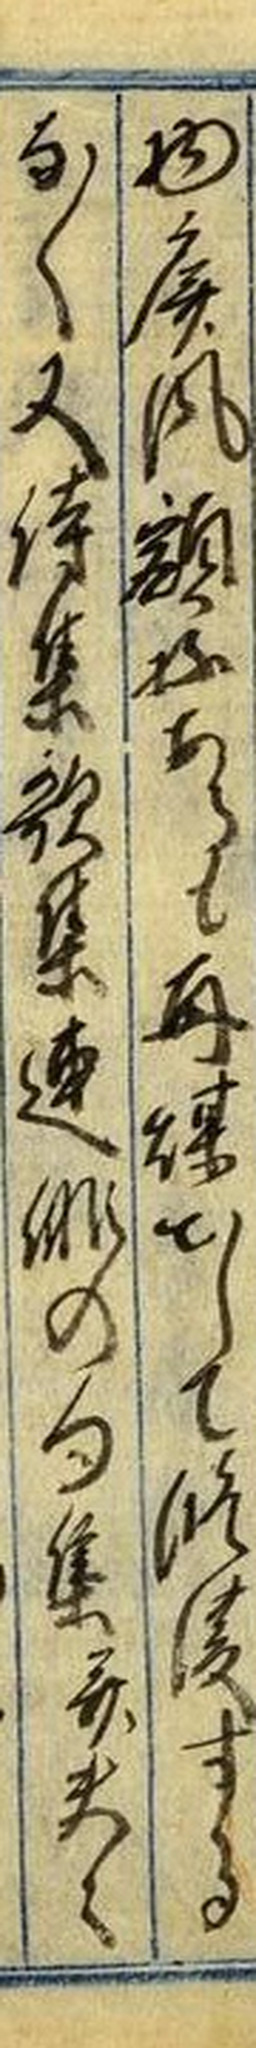なく又詩集歌集連俳の句集并夫々
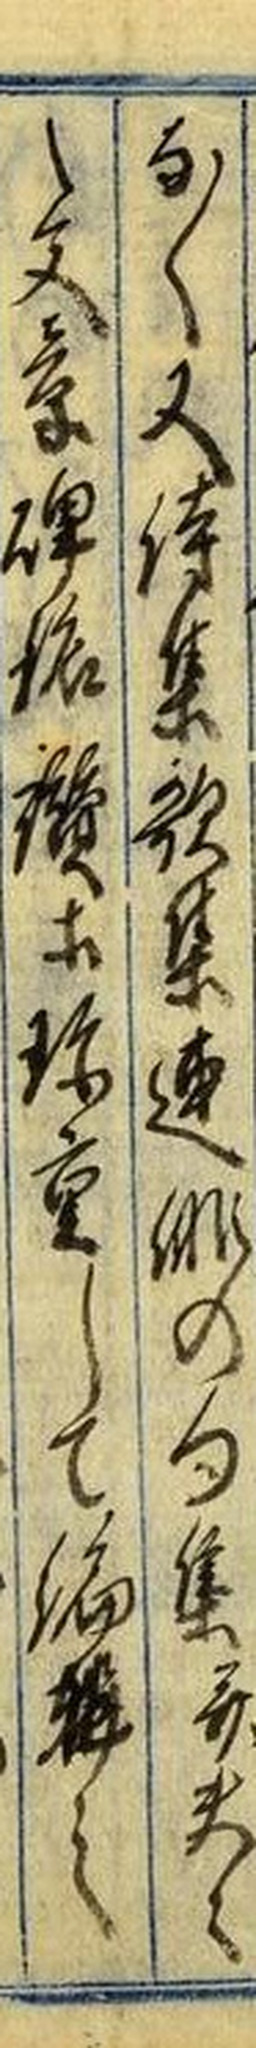之文章碑銘讃等珍重して編輯之
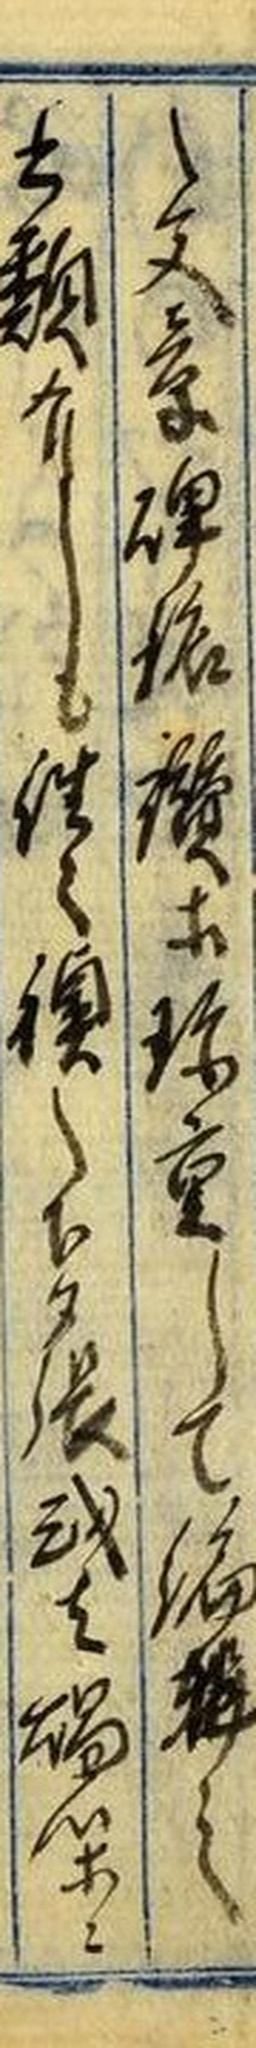書類有しも往々襖之下た張或は燭心等に
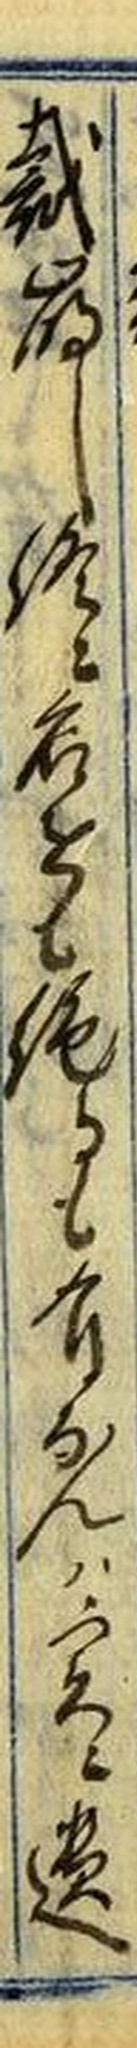裁崩し終に名をも絶るも有なんは実に遺
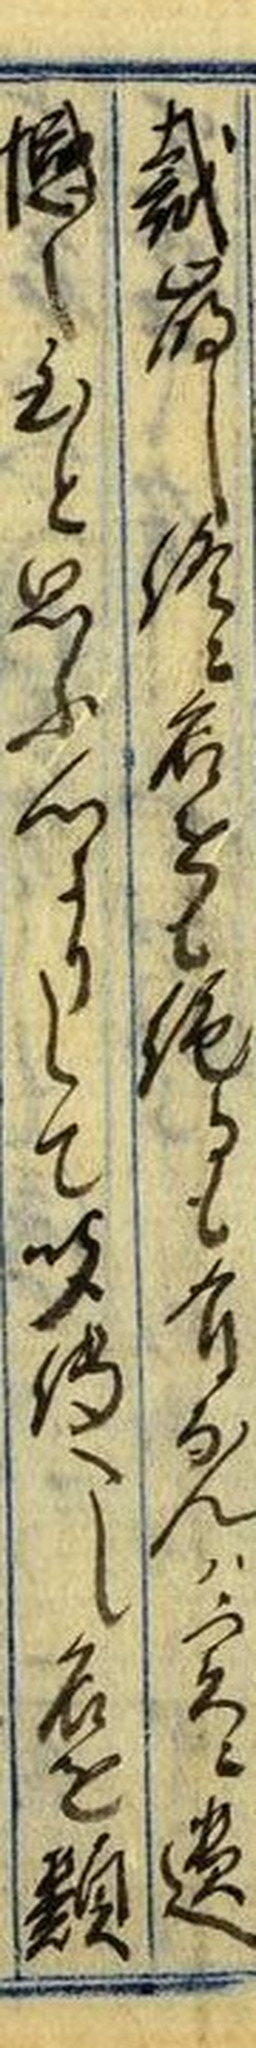憾之至と思ふ心よりして聞伝へし名を類
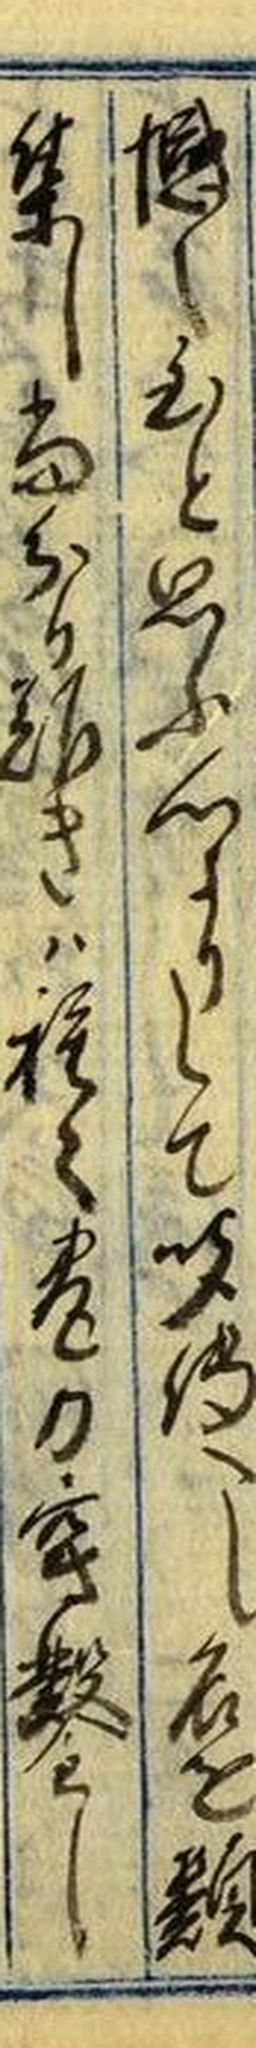集し尚分り難きは種々尽力穿鑿し
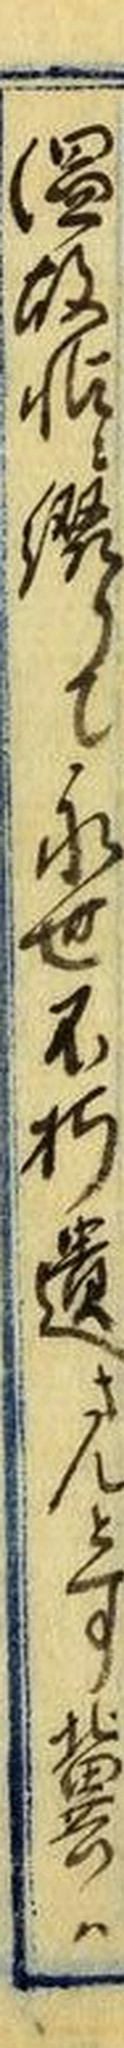温故帳に綴りて永世不朽遺さんとす冀は
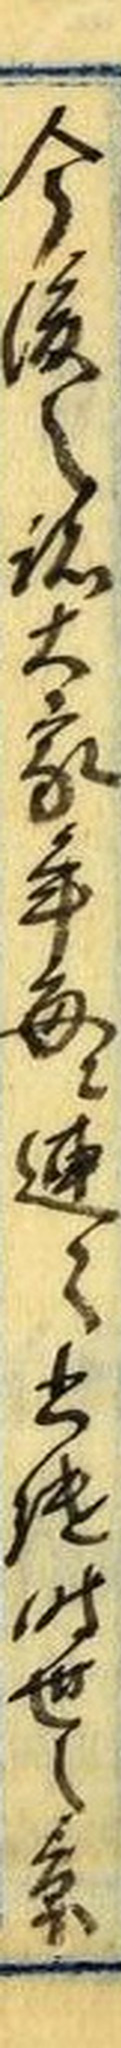今後之諸大家年毎に連々書継時世之景
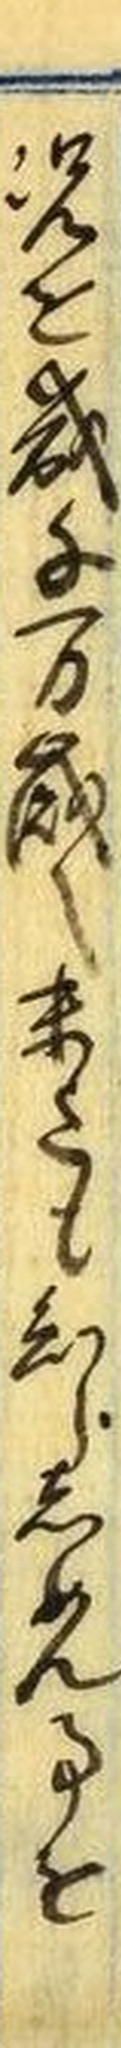況を幾千万歳之末迄も知らしめん事を
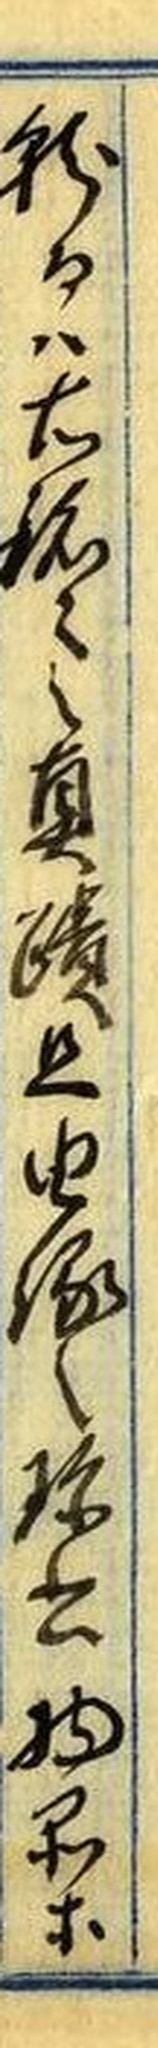就而は右銘々之真蹟且由縁之珍書物品等
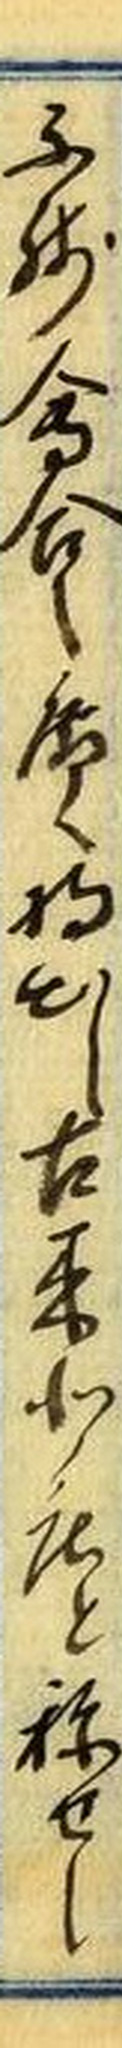不残会合し広く持出し古来北ノ庄と称せし
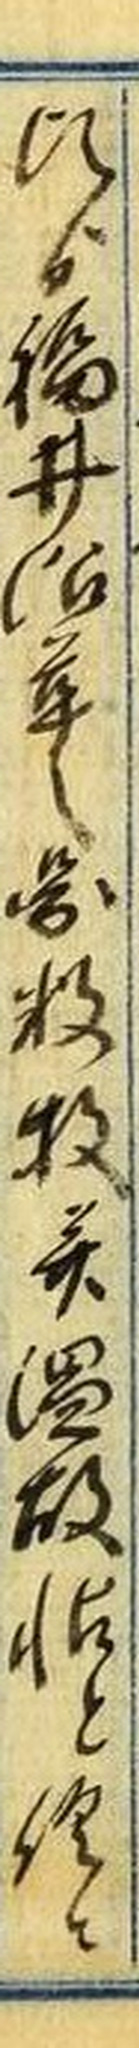比ゟ福井沿革之図数枚并温故帳と俱に
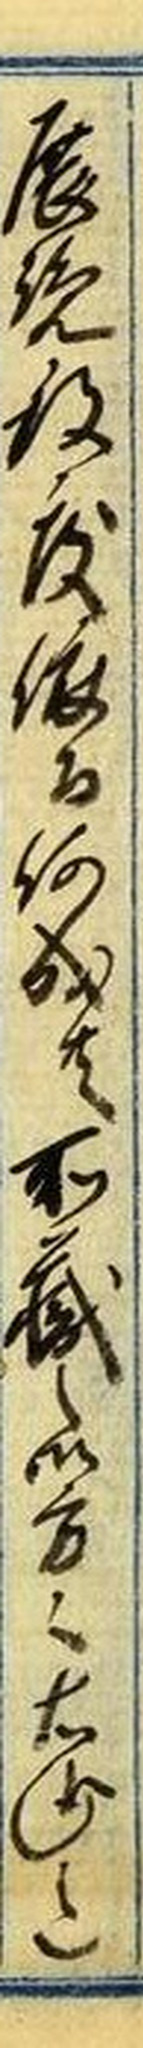展覧致度依而何成共所蔵之御方々右趣意
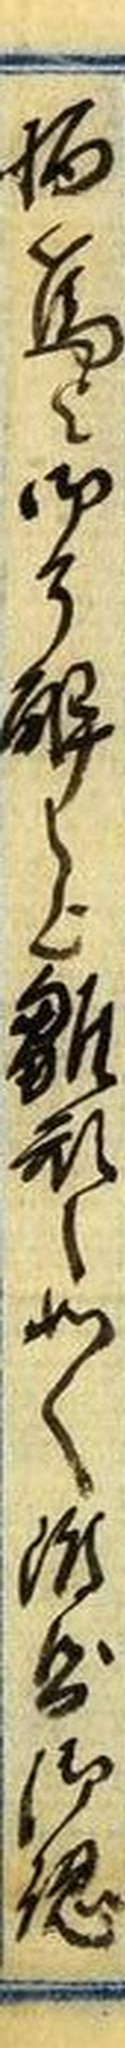柄篤と御了解之上雛形之如く附図御認
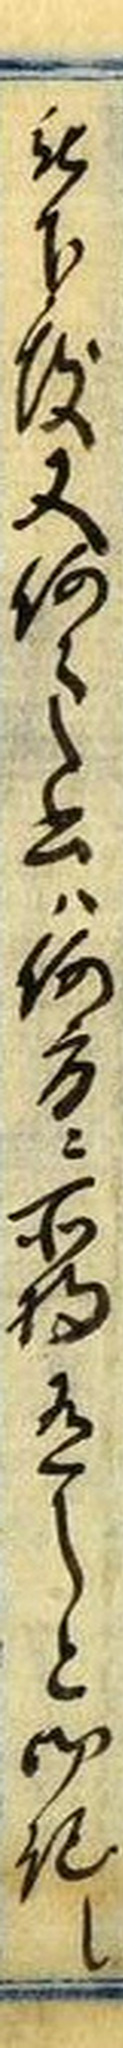被下度又何々之書は何方に所持有之と御記し
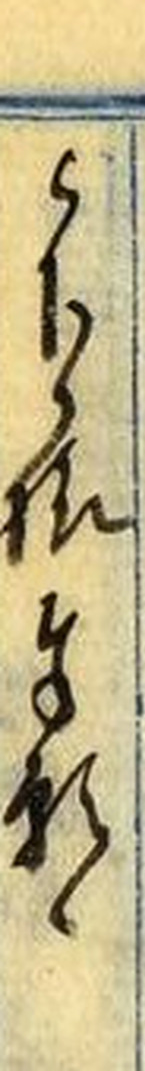被下候様奉願候
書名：温古集 四巻
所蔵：福井県文書館 Fukui Prefectural Archives
